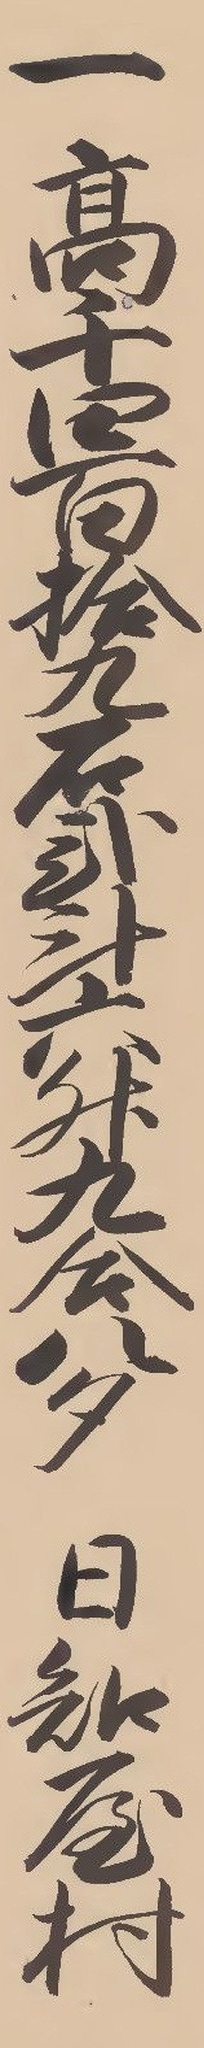一高千四百捨九石弐斗六升九合八勺日知屋村
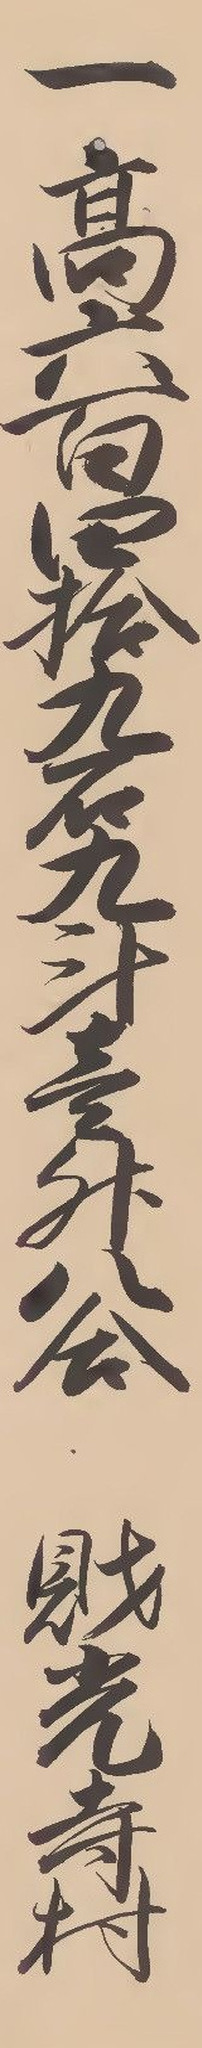一高六百四拾九石九斗壱升八合財光寺村
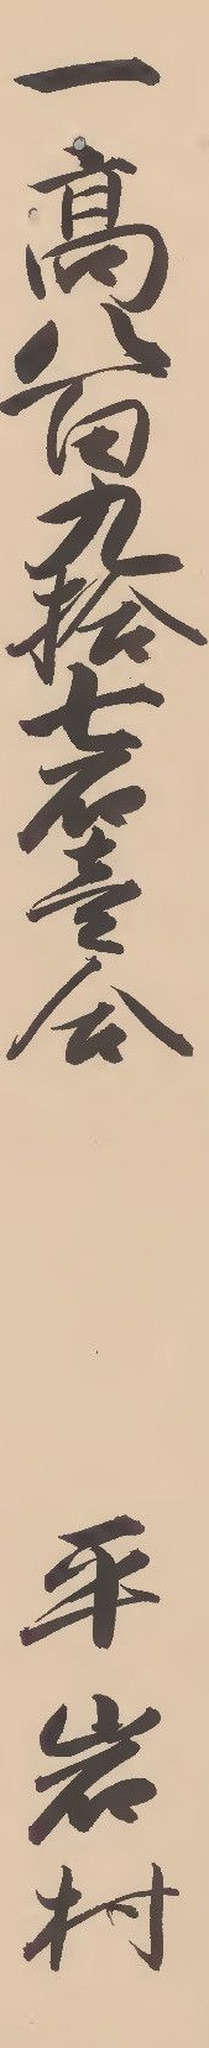一高八百九拾七石壱合平岩村
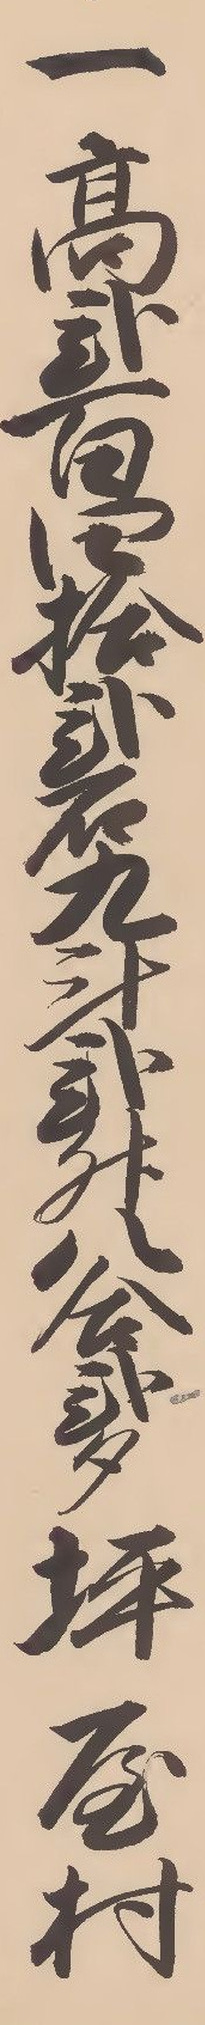一高弐百四拾弐石九斗弐升八合弐勺坪屋村

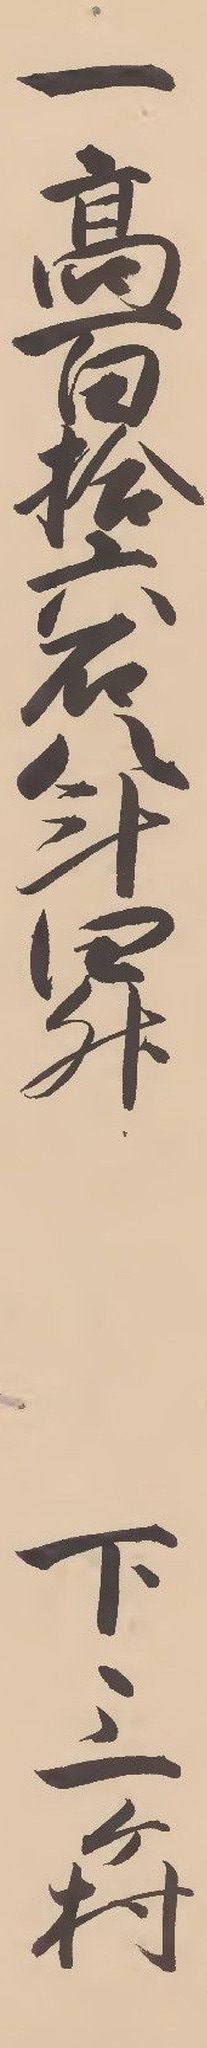一高百拾六石八斗四升下三ヶ村
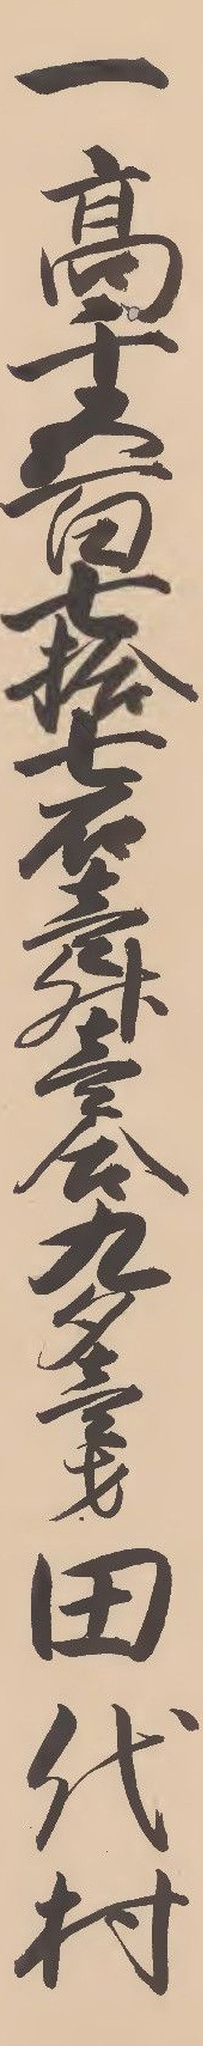一高千五百七拾七石壱升壱合九勺壱才田代村
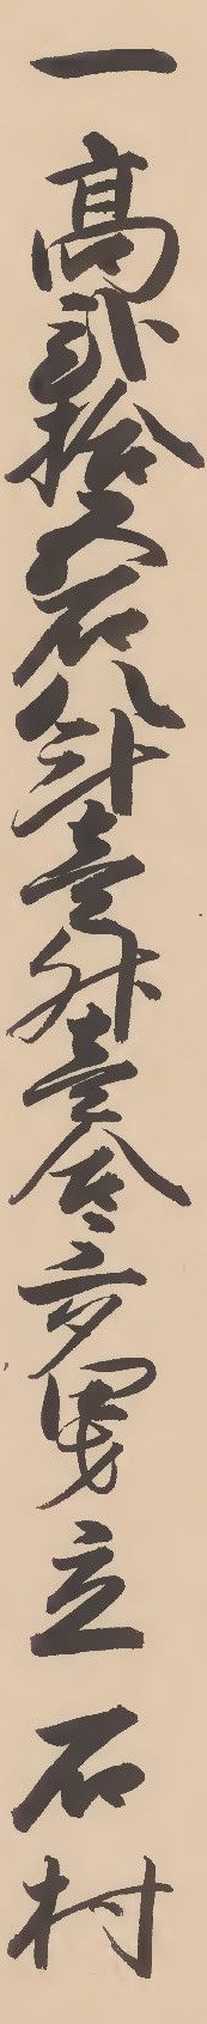一高弐拾五石八斗壱升壱合三勺四才立石村
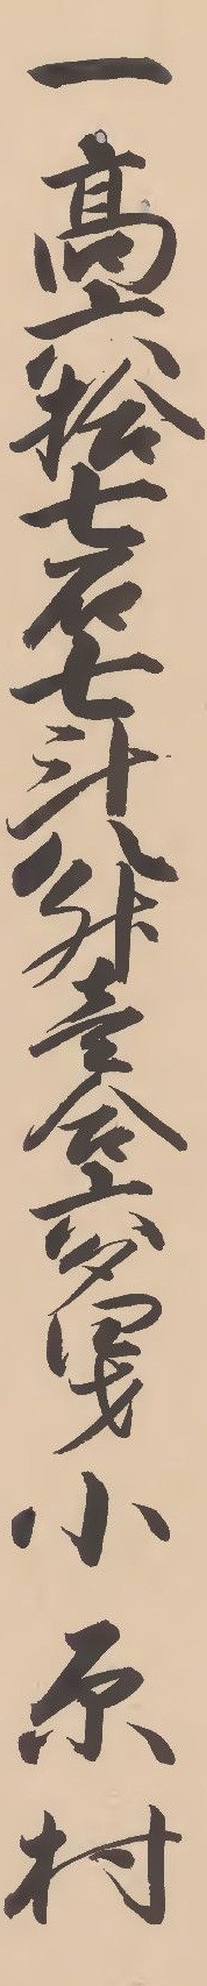一高六拾七石七斗弐八升壱合六勺四才小原村
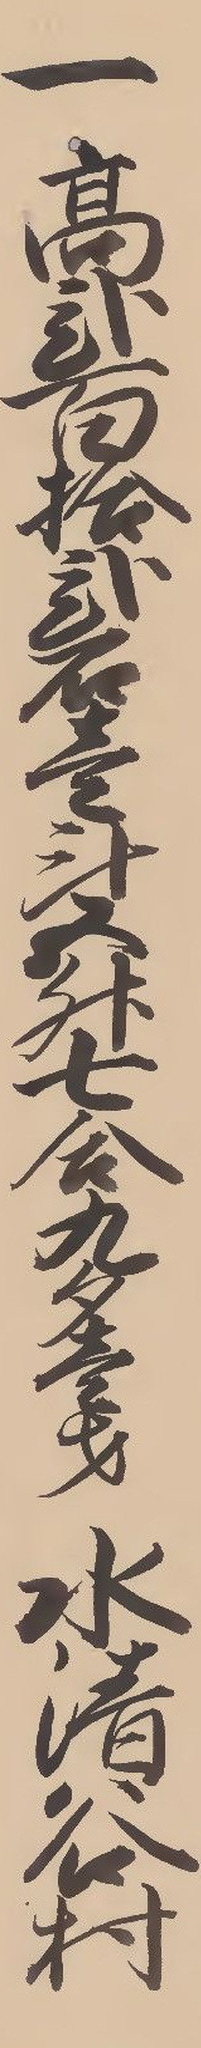一高弐百拾弐石壱斗五升七合九勺壱才水清谷村
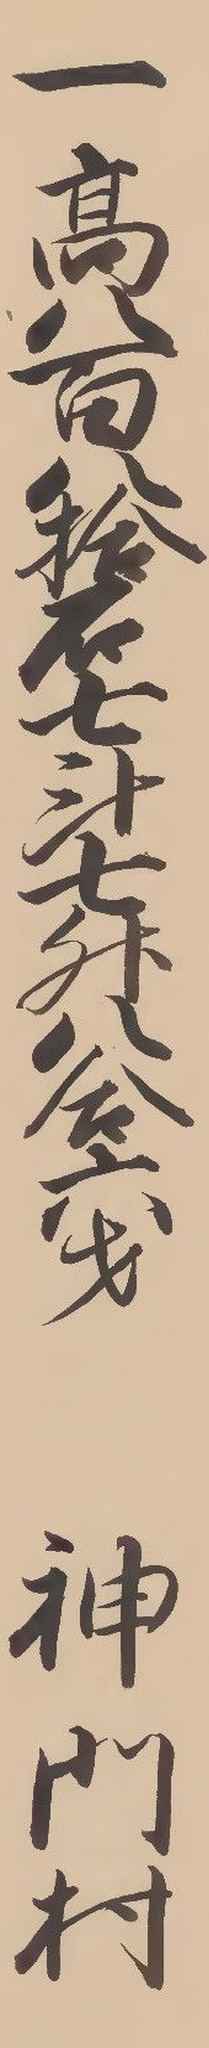一高八百八拾石七斗七升八合六才神門村
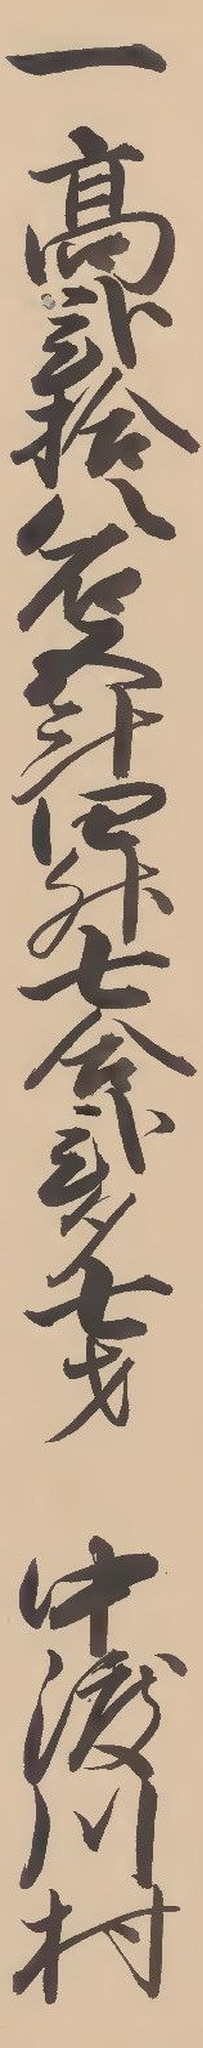一高弐拾八石五斗四升七合弐勺七才中渡川村
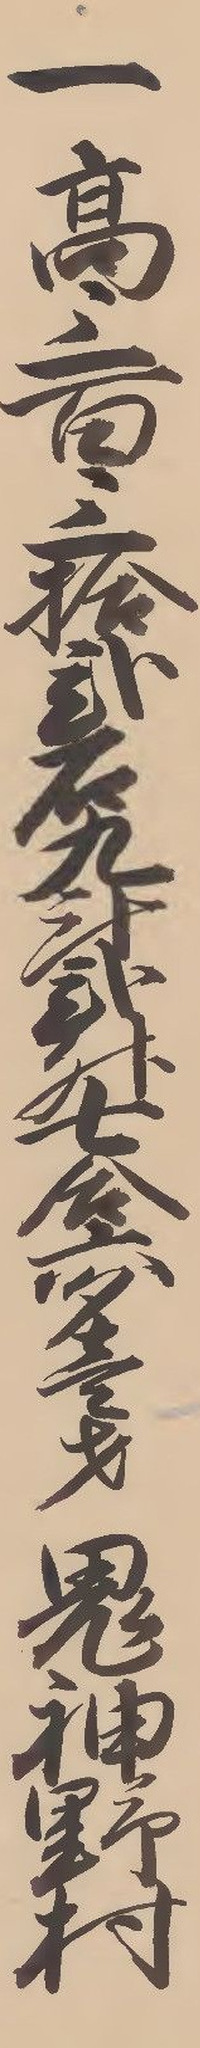一高三百三拾弐石九斗弐升七合六勺壱才鬼神野村

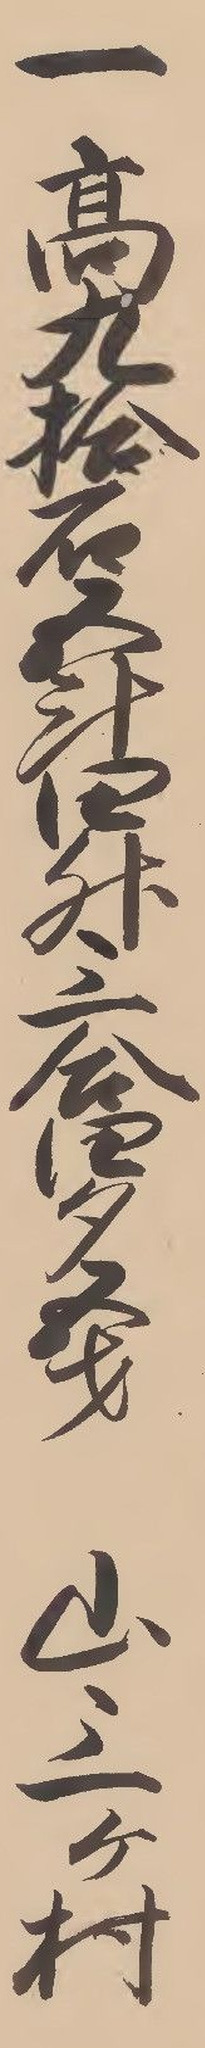一高九拾石五斗四升三合四勺五才山三ヶ村
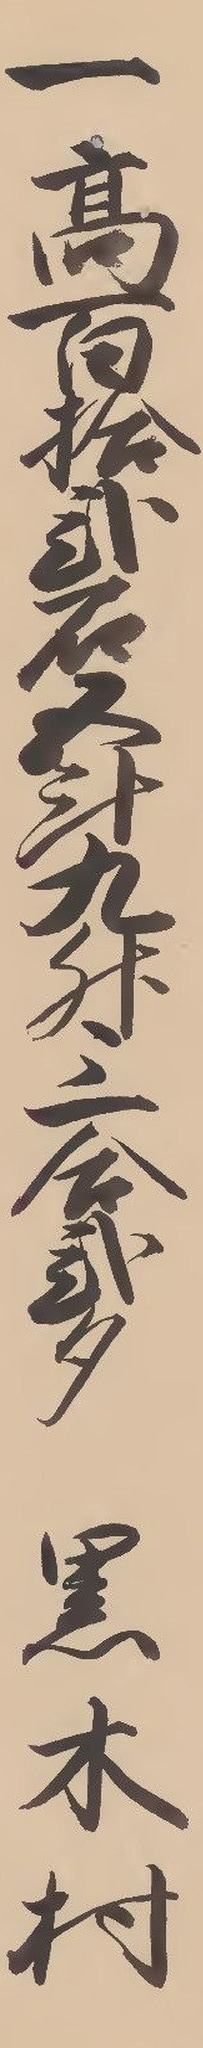一高百拾弐石五斗九升三合弐勺黒木村
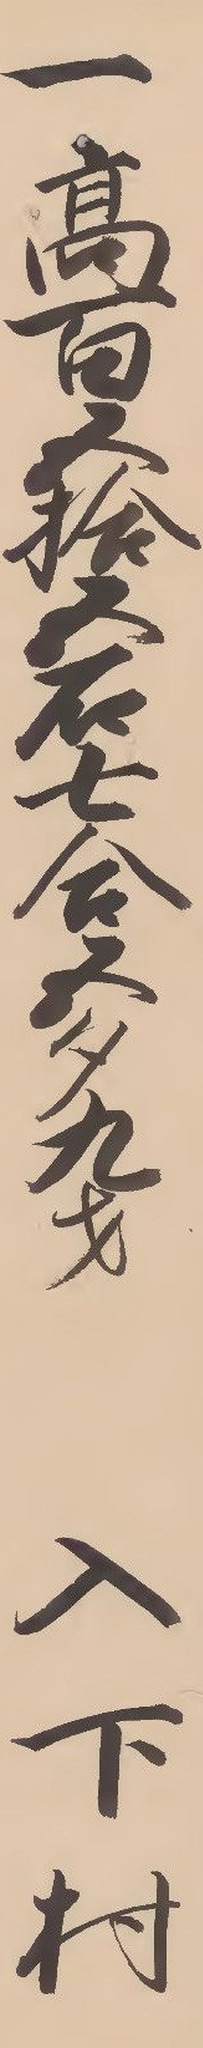一高百五拾五石七合五勺九才入下村
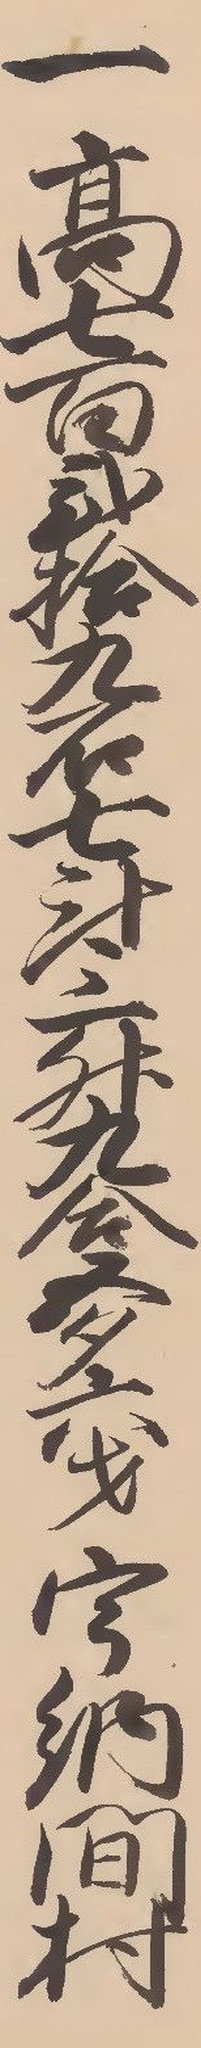一高七百弐拾九石七斗三升九合五勺六才宇納間村
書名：日向国郷帳
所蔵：国立公文書館 National Archives of Japan
